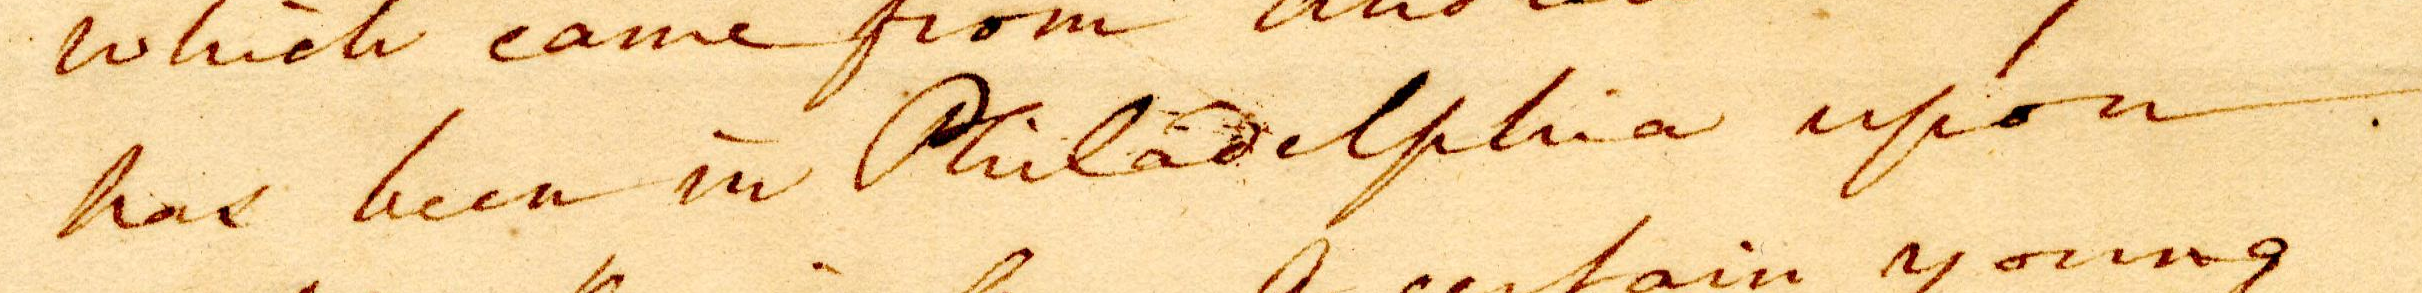has been in Philadelphia upon
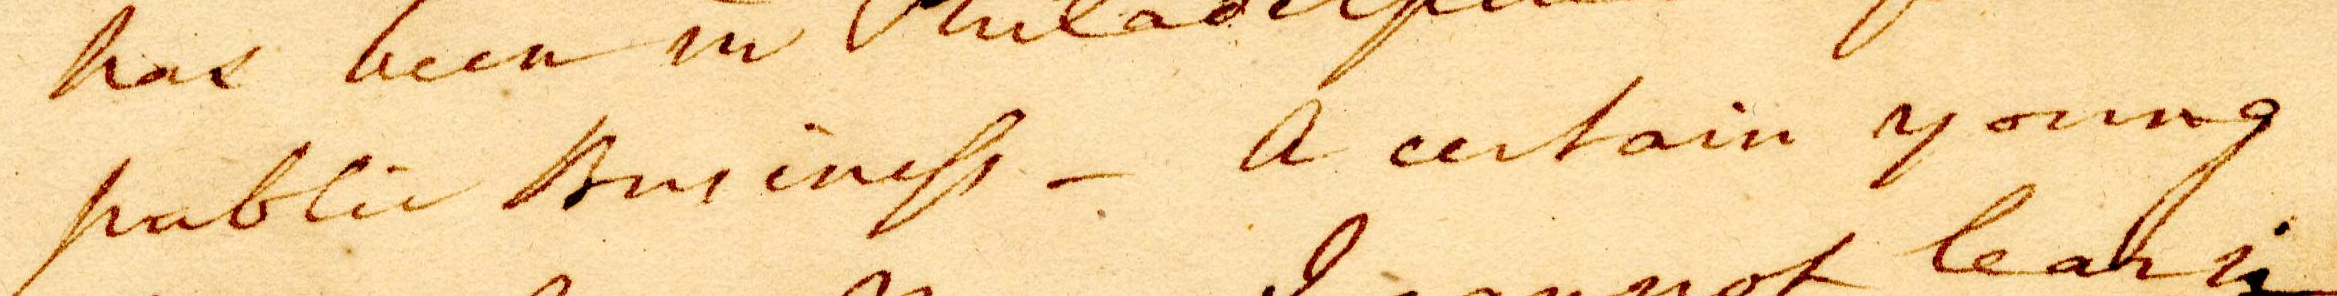public Business. A certain young
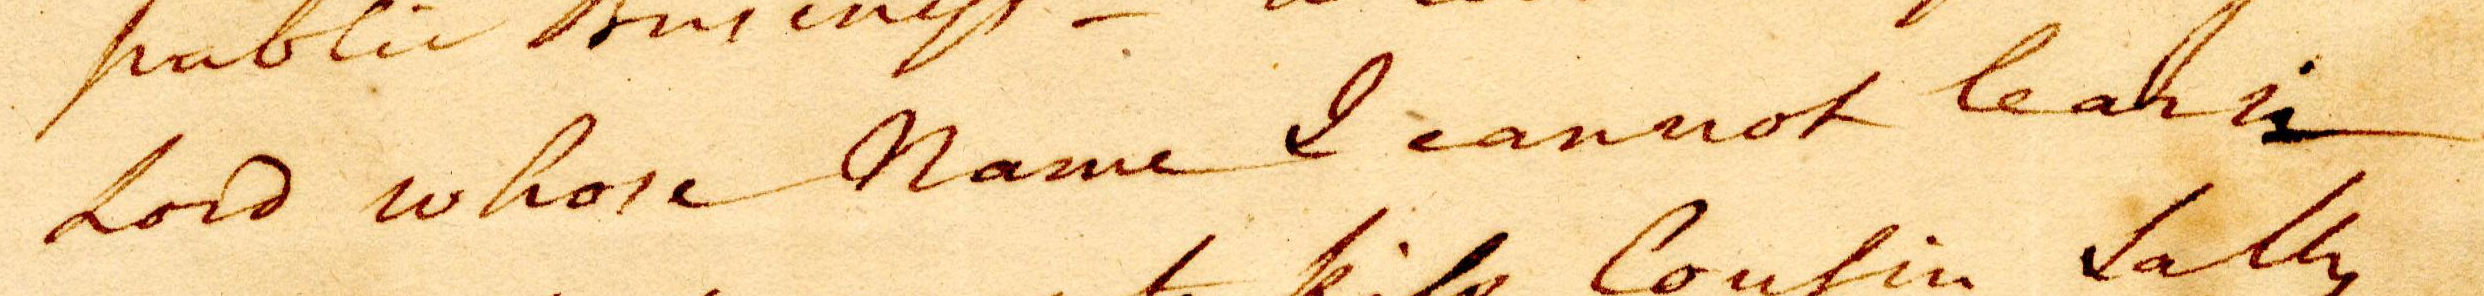Lord whose Name I cannot learn
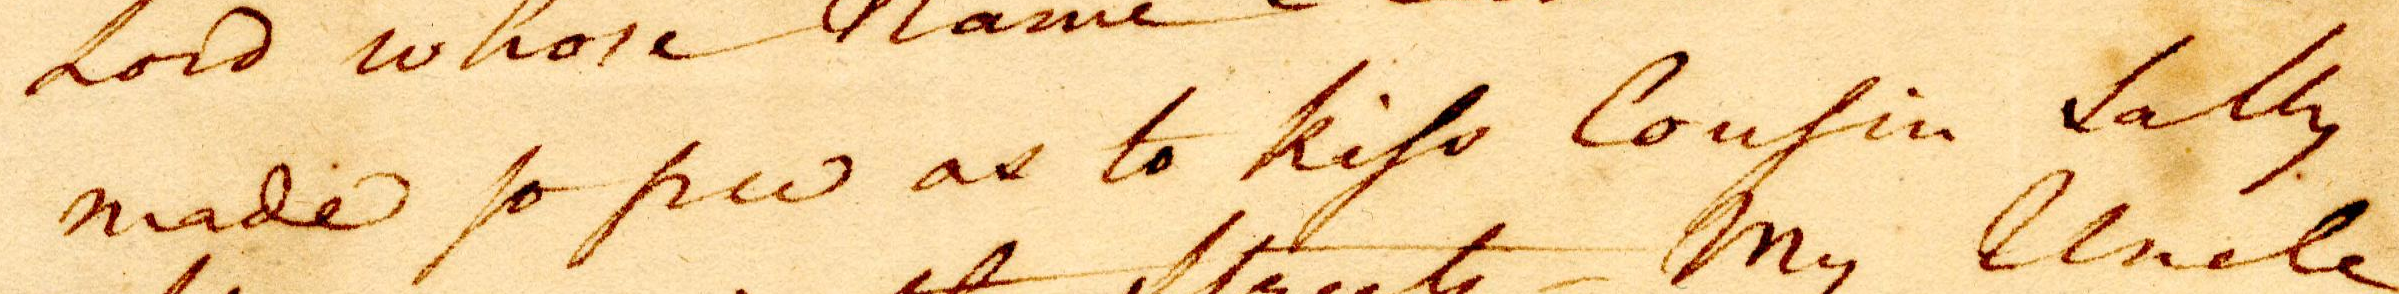made so free as to kiss Cousin Sally
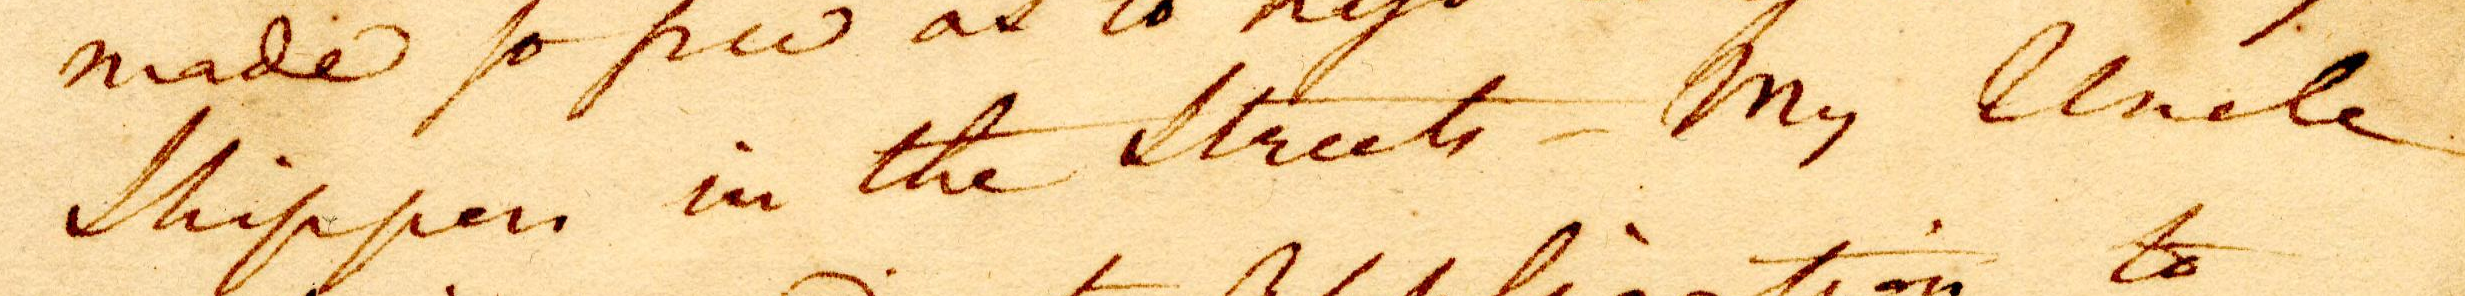Shippen in the Streets. My Uncle
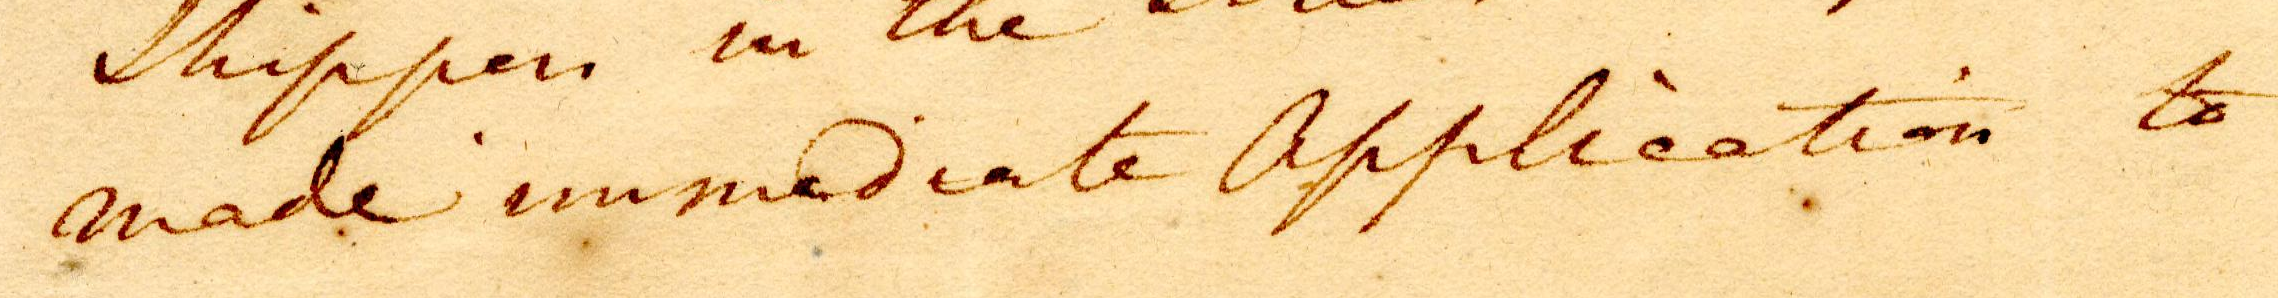made immediate Application to
